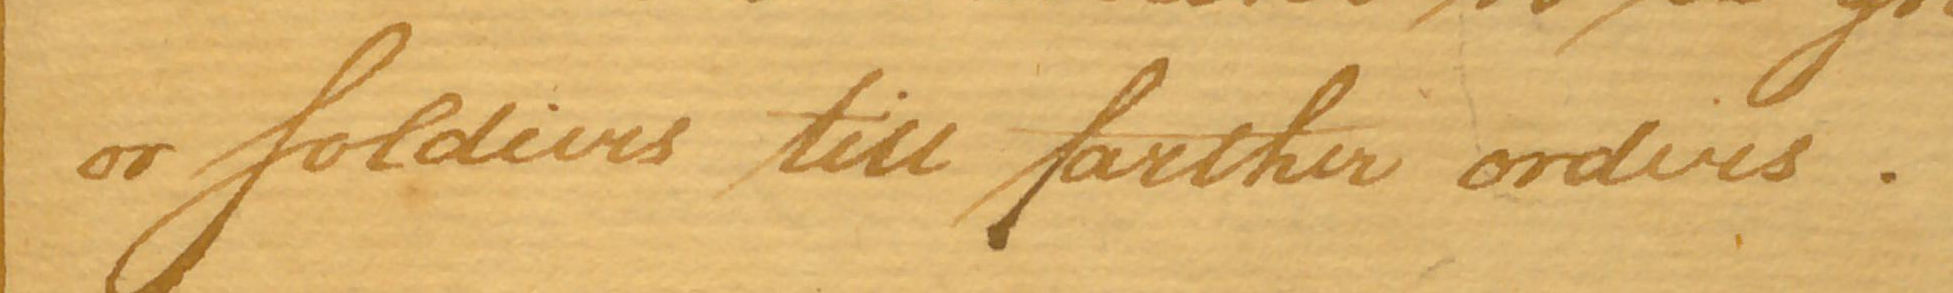or soldiers till farther orders.
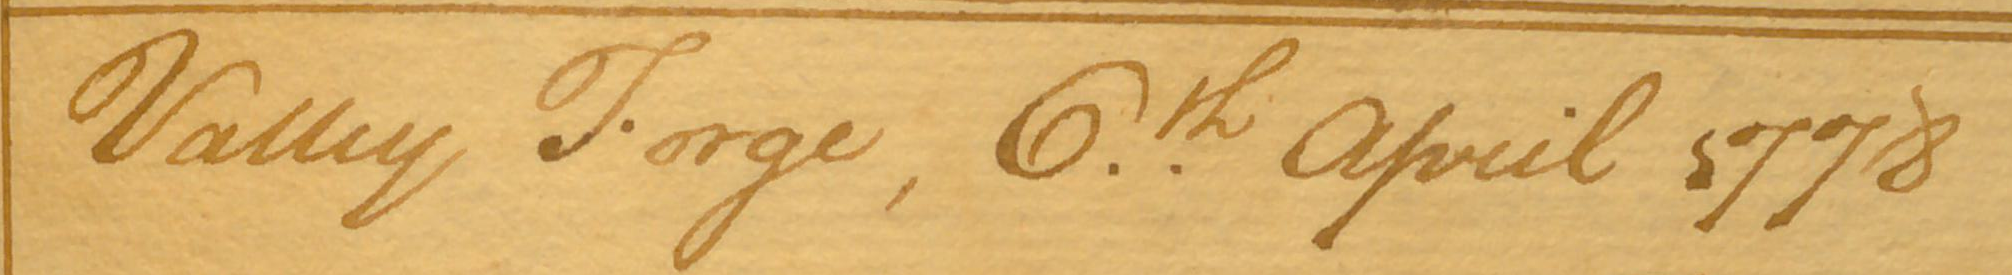Valley Forge, 6^th. April 1778
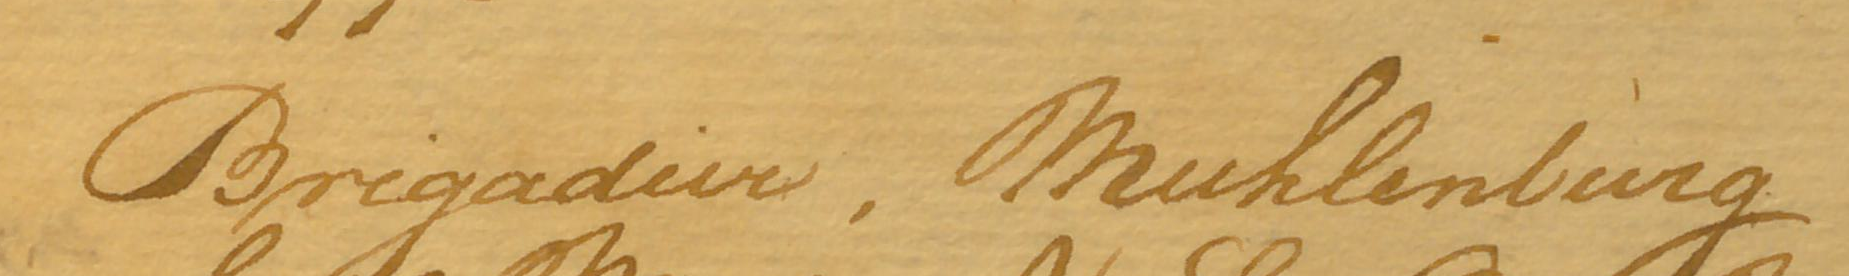Brigadier, Muhlenburg
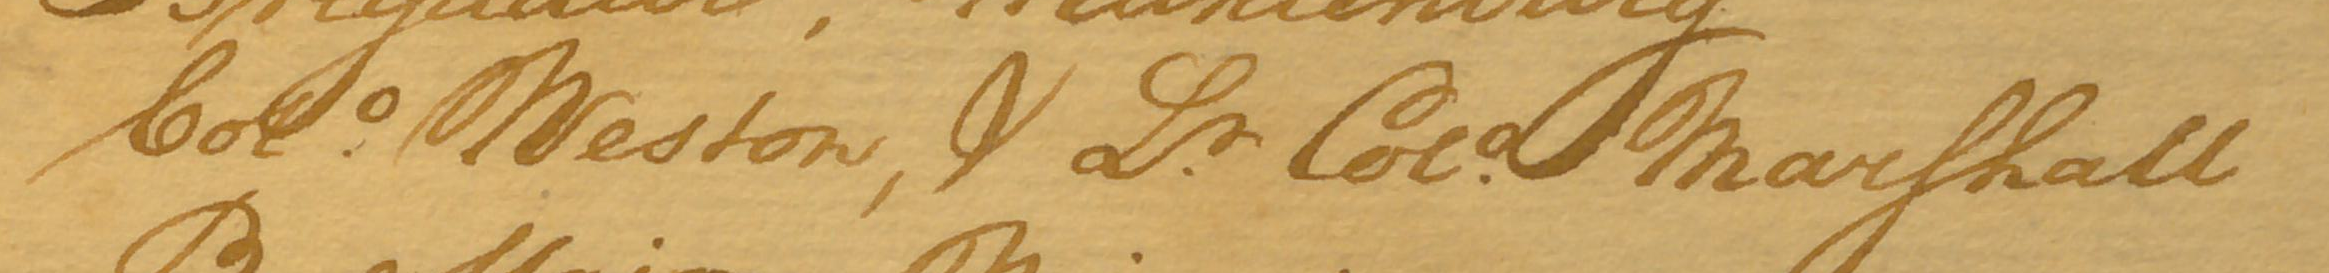Col^o. Weston, & L^t. Col^o. Marshall
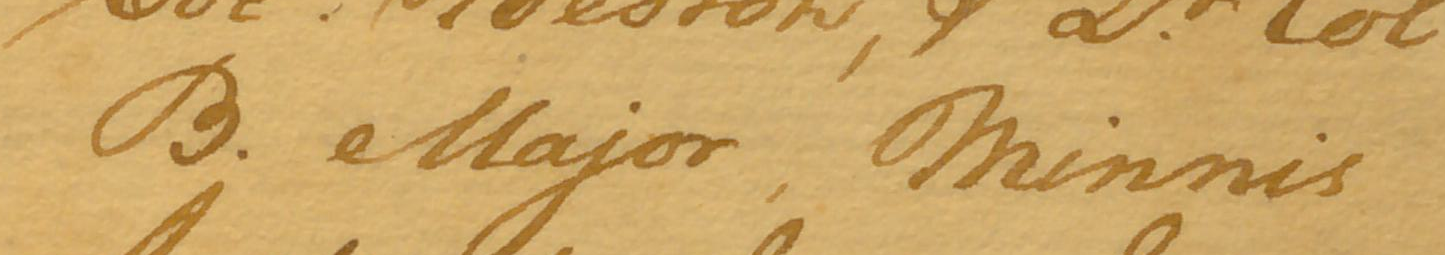B. Major, Minnis
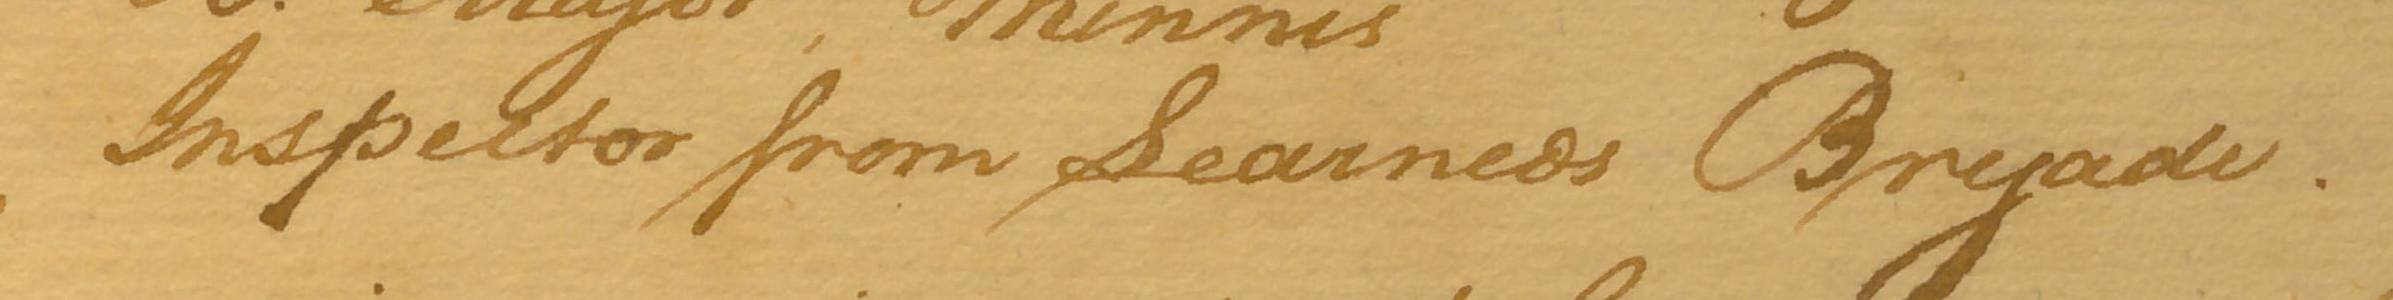Inspector from Learneds Brigade.
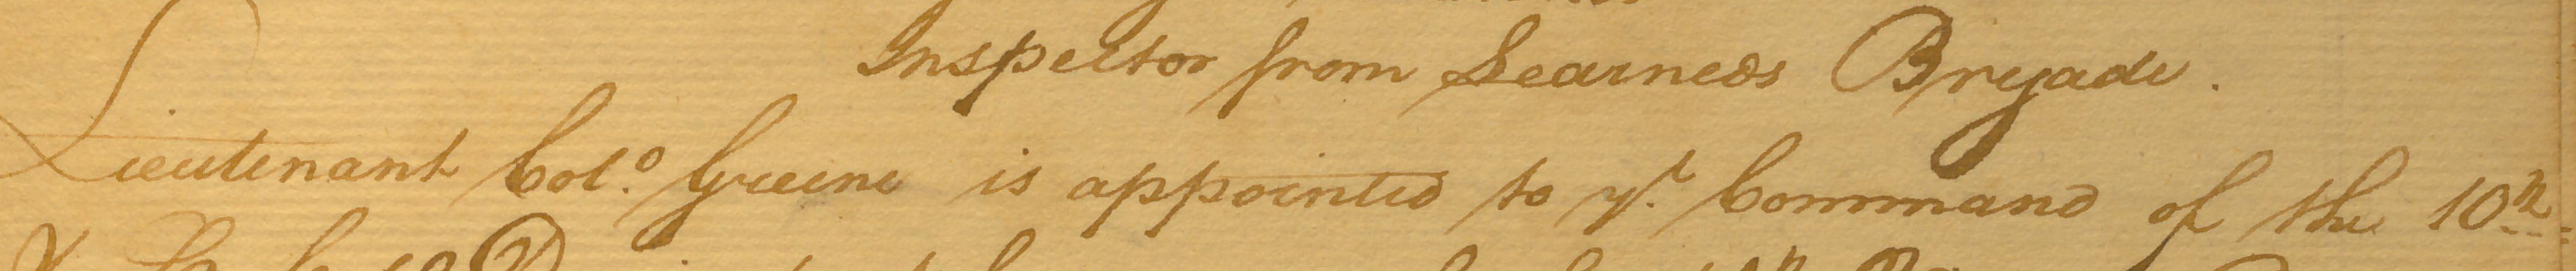Lieutenant Col^o. Greene is appointed to y^e. Command of the 10^th.
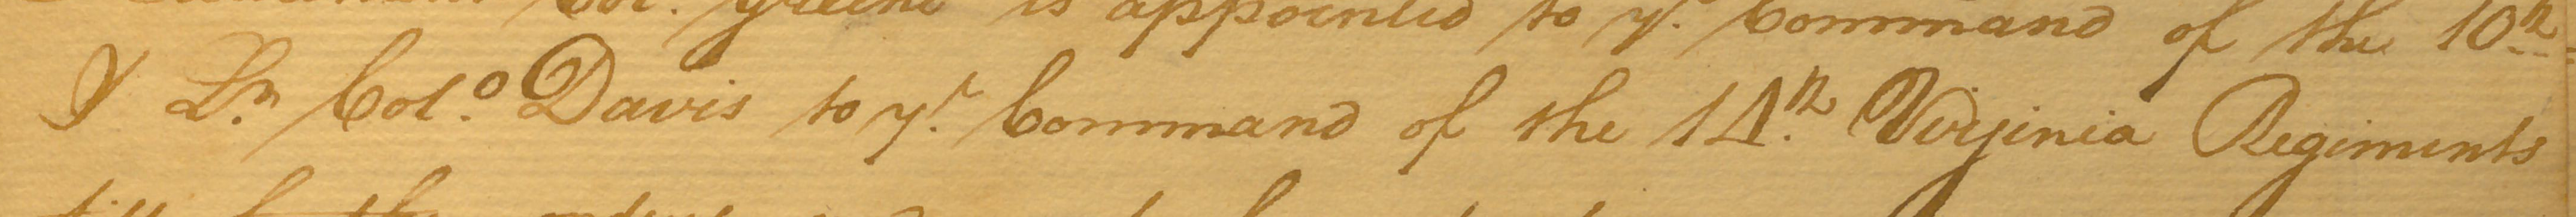& L^t. Col^o. Davis to y^e. Command of the 14^th. Virginia Regiments
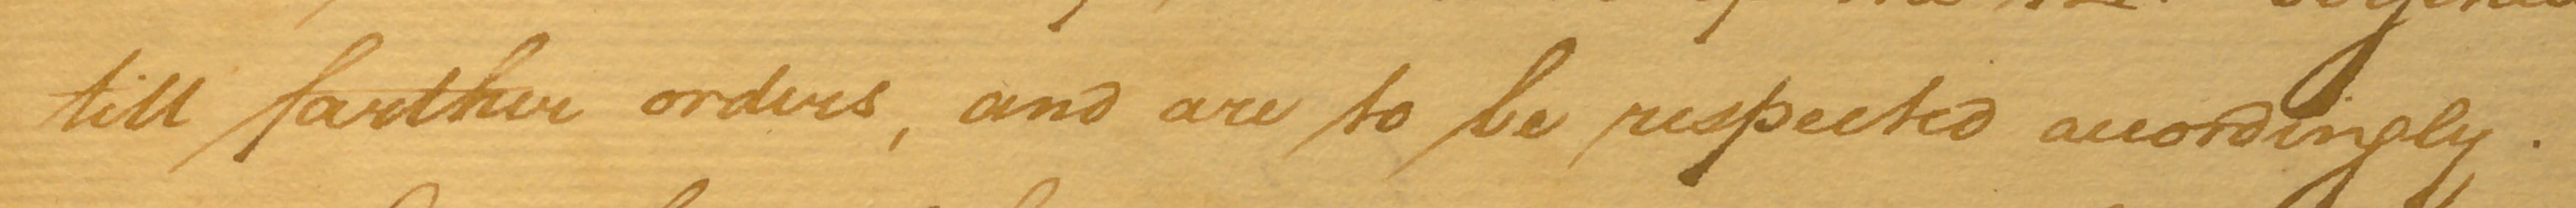till farther orders, and are to be respected accordingly.
